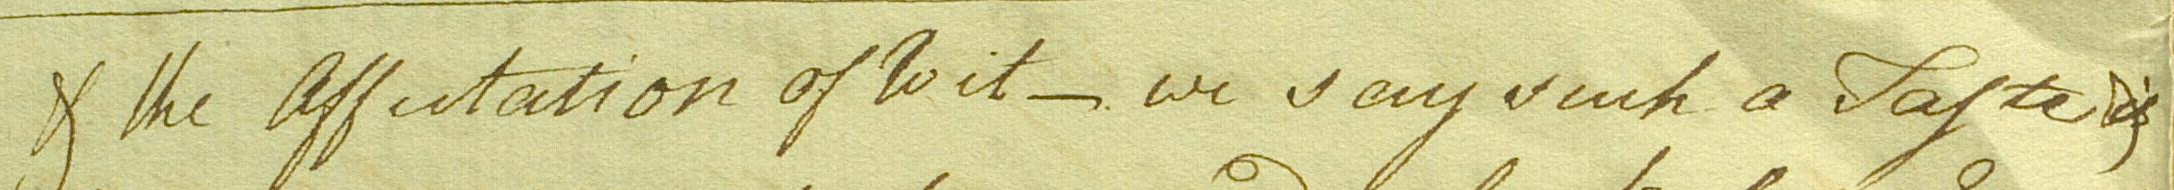& the Affectation of Wit- we say such a Taste &
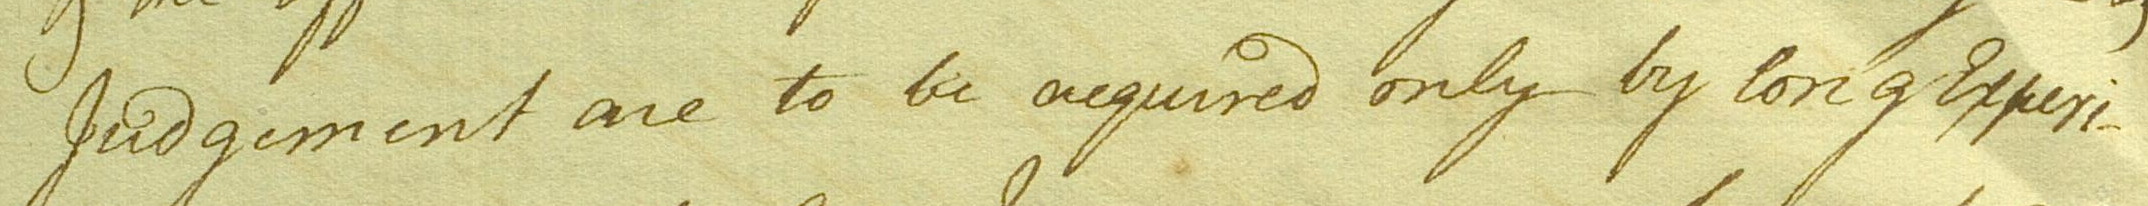Judgement are to be acquired only by long Experi-
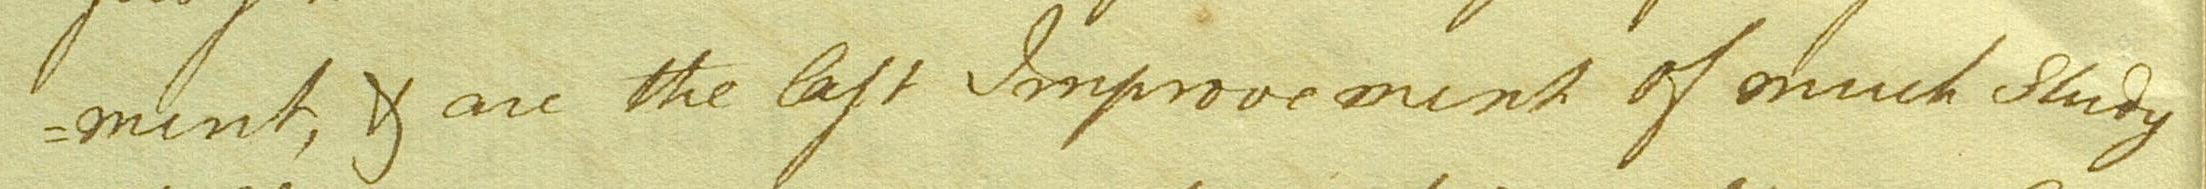-ment, & are the last Improvement of much Study
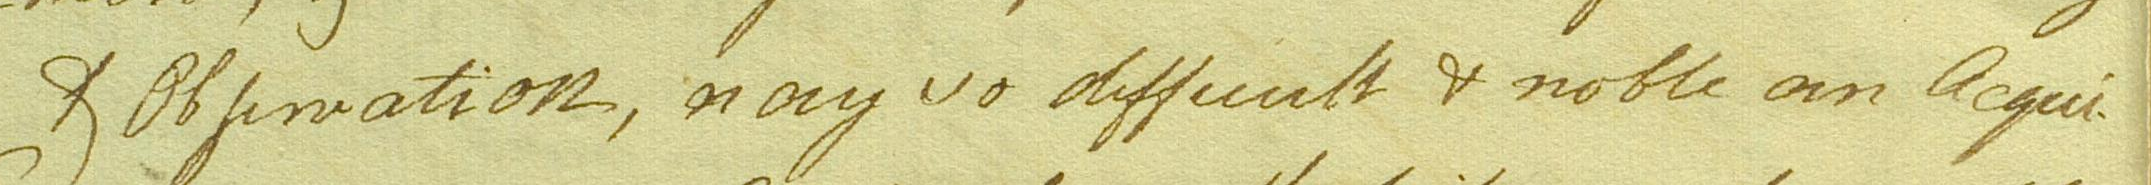& Observation, nay so difficult & noble an Acqui-
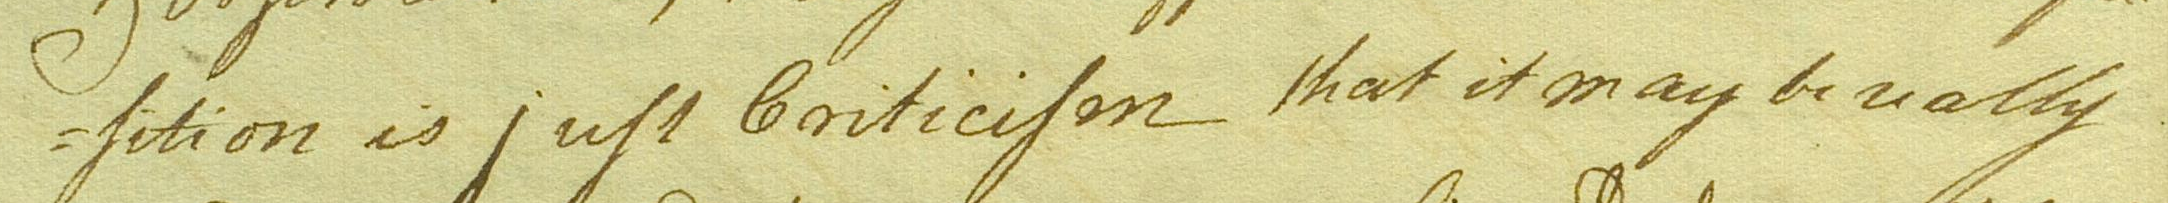-sition is just Criticism that it may be vastly
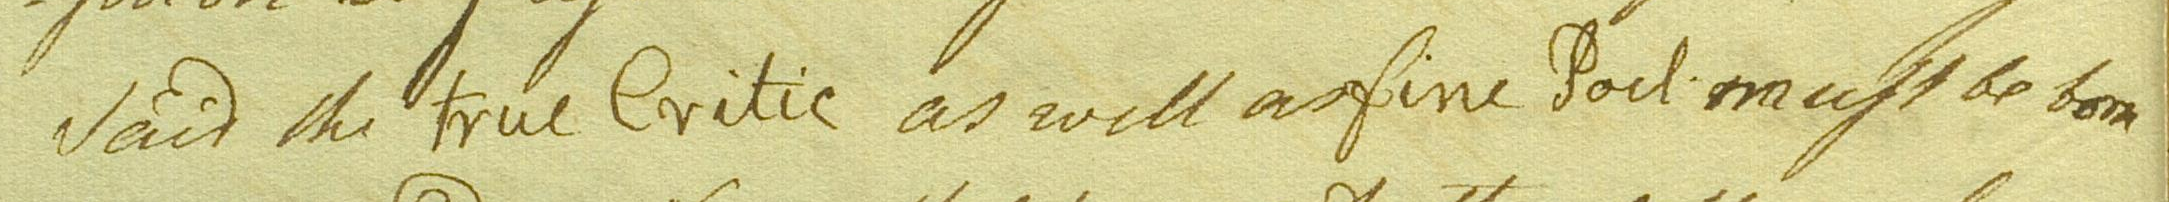said the true Critic as well as fine Poet must be born
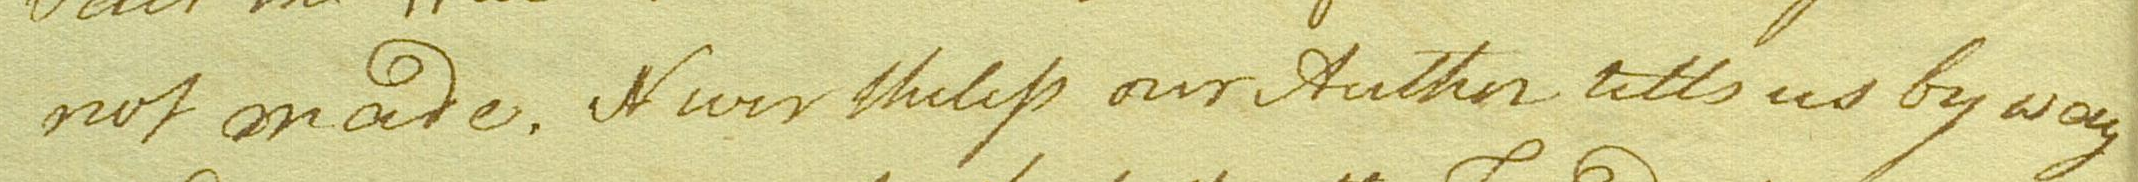not made. Nevertheless, our Author tells us by way
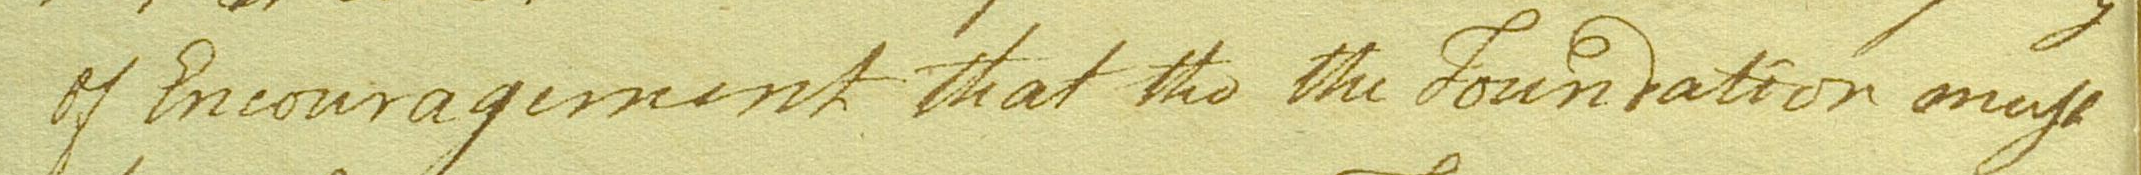of Encouragement that tho the Foundation must
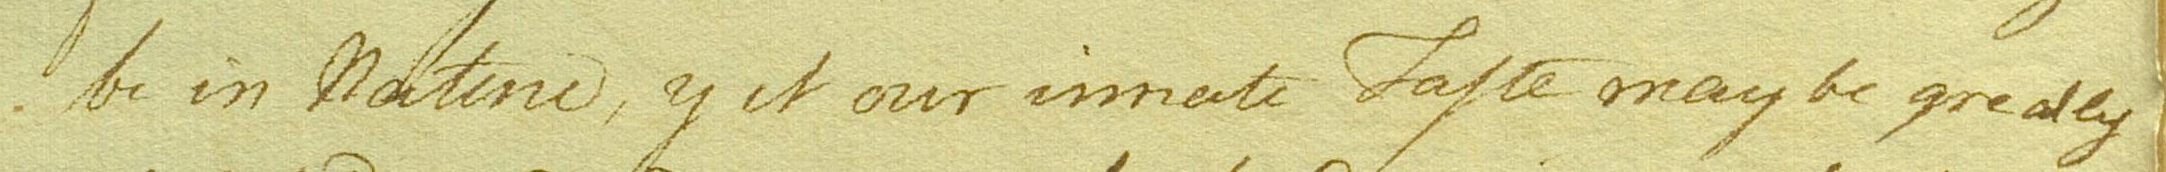be in Nature, yet our innate Taste may be greatly
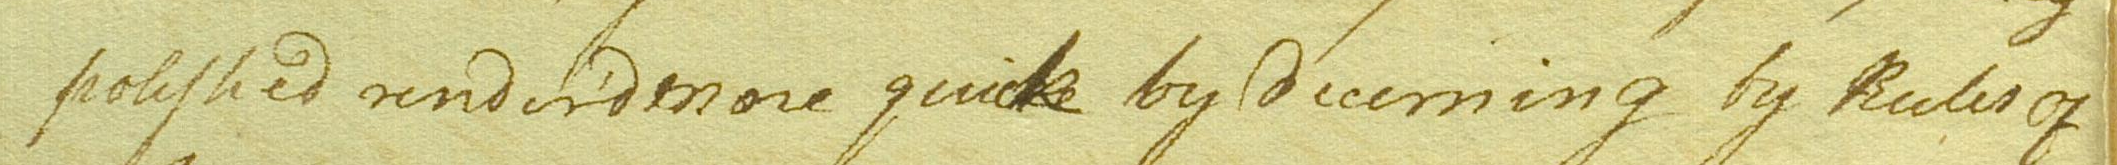polished render'd more quick by decerning by Rules of
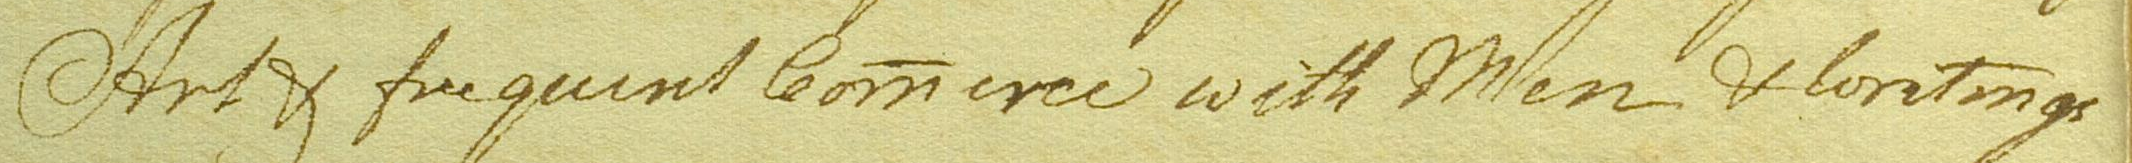Art & frequent Com̄erce with Men & Writings
